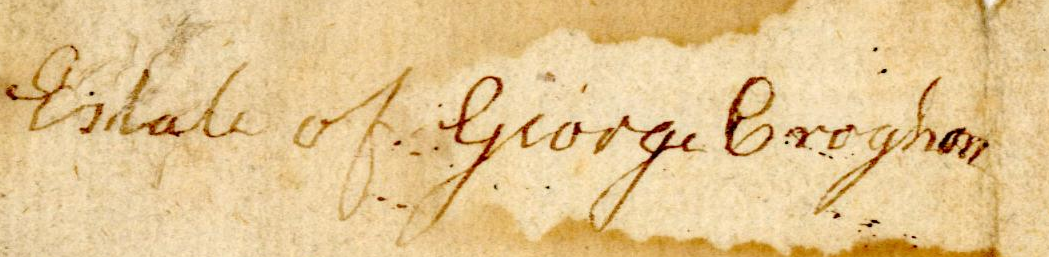Estate of George Croghan
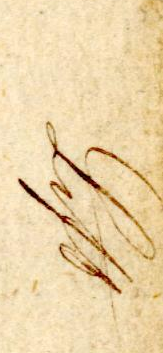Lift
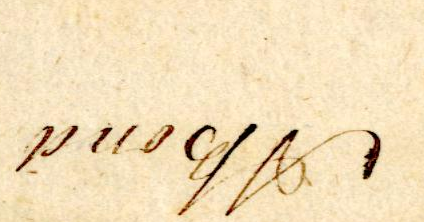A Bond
